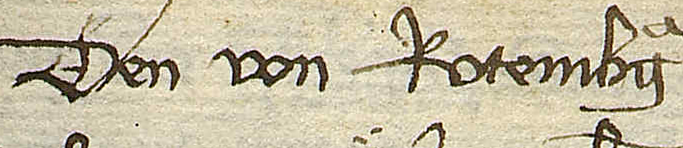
Den von Rotemb*g
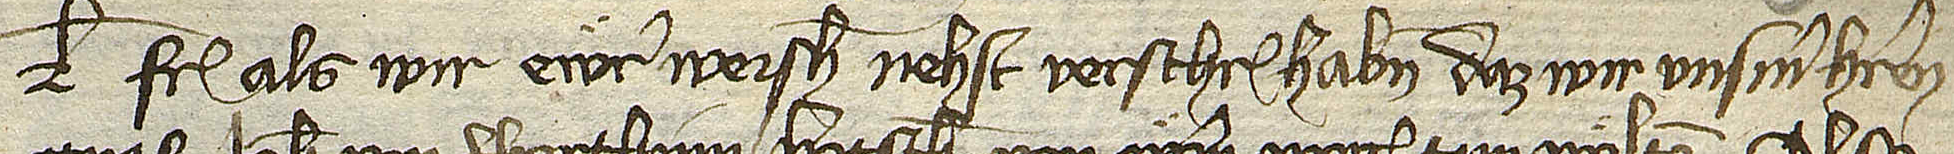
L* fr* als wir eẅr* weiſh* nehſt verſchr* habn* daʒ wir vnſm* h*ren
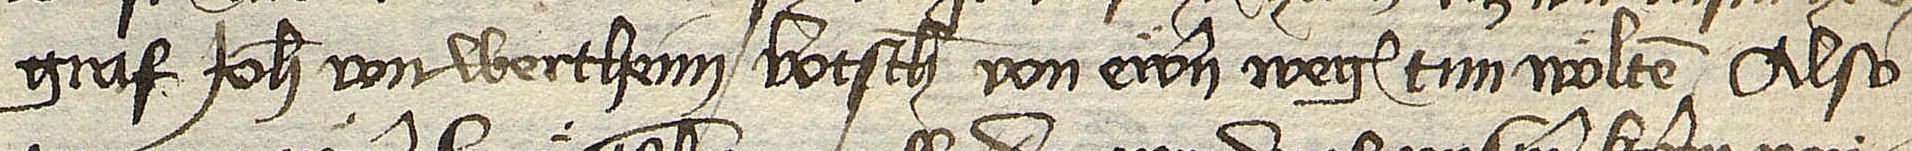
graf Ioh* von Wertheim botſch* von eẅ*n weg* tun wölte* Alſo
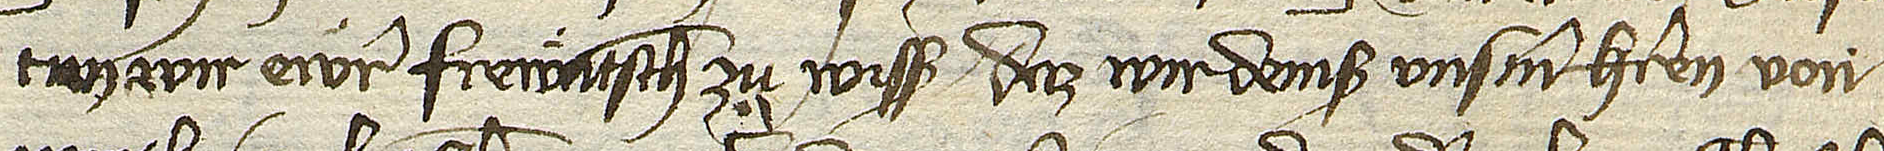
tun wir eẅr* freẅntſch* ʒu wiſſ* / daʒ wir demſ* vnſm* h*ren von
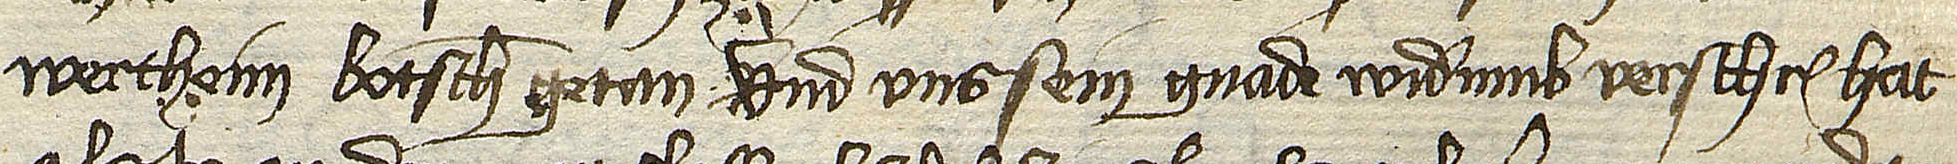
wertheim botſch* getan . Vnd vns ſein gnade wid*umb verſchr* hat
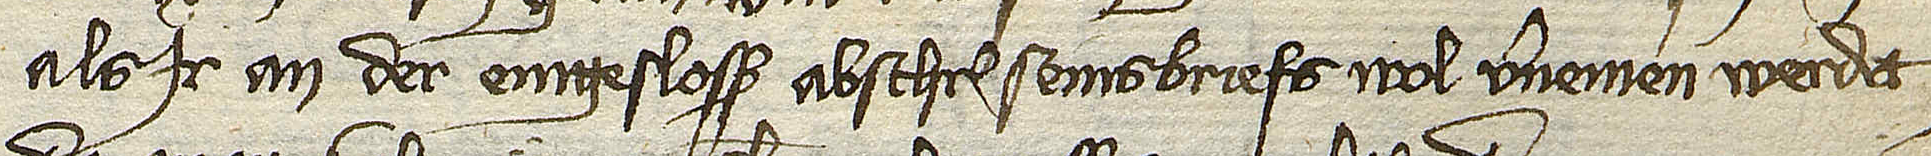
als Ir an der eingeſloſſ* abſchr* ſeins briefs wol v*nemen werdet
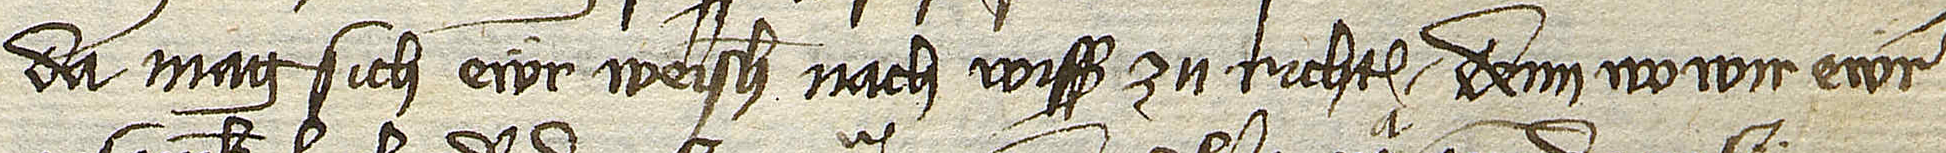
da mag ſich eẅr weiſh* nach wiſſ* ʒu richt* / Denn wo wir eẅr*
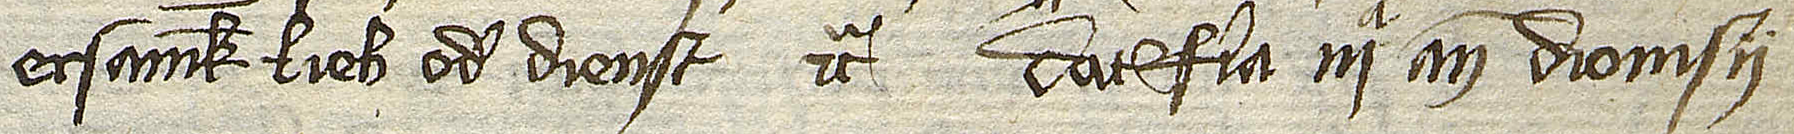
erſamk* lieb od* dienſt ec* Dat* fi*a iii* an* dioniſii
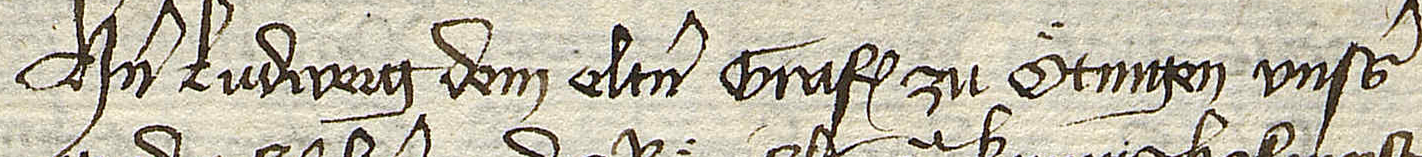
Hn* Ludweig dem eltn* Graf* ʒu Ötingen vnſs*
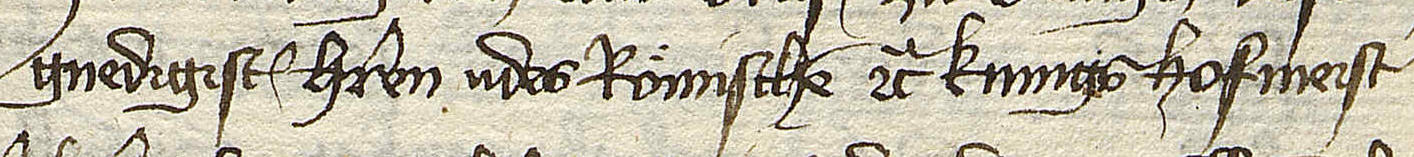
gnedigiſt* h*ren ~ des Römiſche* ec* kunigs hofmeiſt*
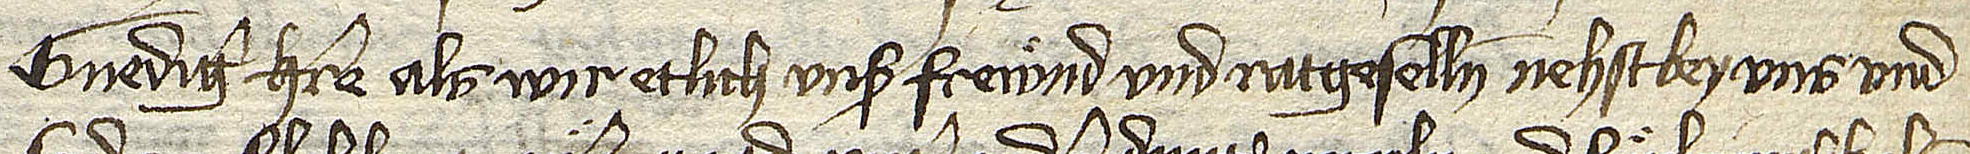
Gnedig* h*re als wir etlich vnſ* freẅnd vnd ratgeſelln* nehſt bey vns vnd
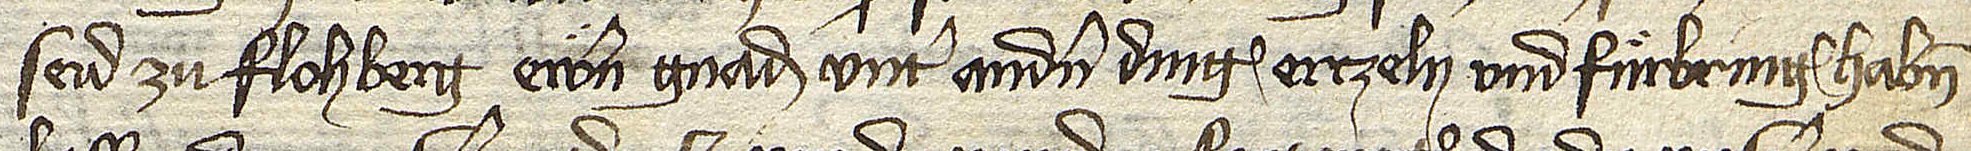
ſeid ʒu flohberg eẅ*n gnad* vnt* andn* ding* ercʒeln vnd fürbring* habn*
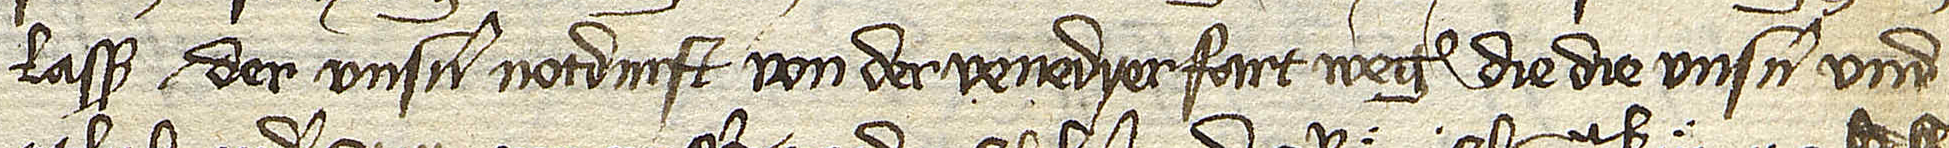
laſſ* / der vnſn* notdurft von der venedyer fart weg* die die vnſn* vnd
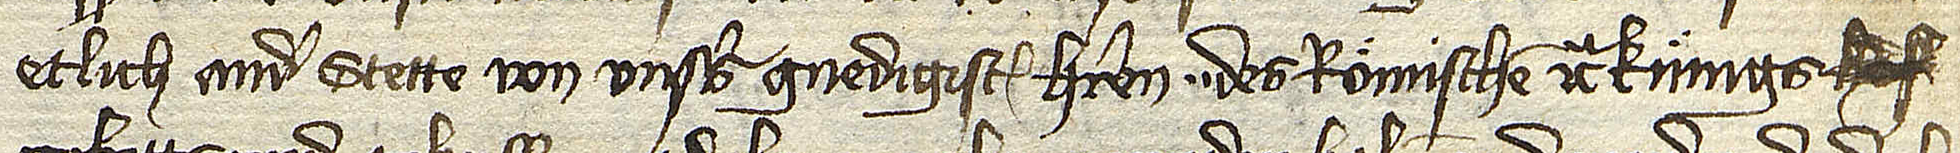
etlich and* Stette von vnſ*s gnedigiſt* h*ren ~ des Römiſche* ec* künigs hof
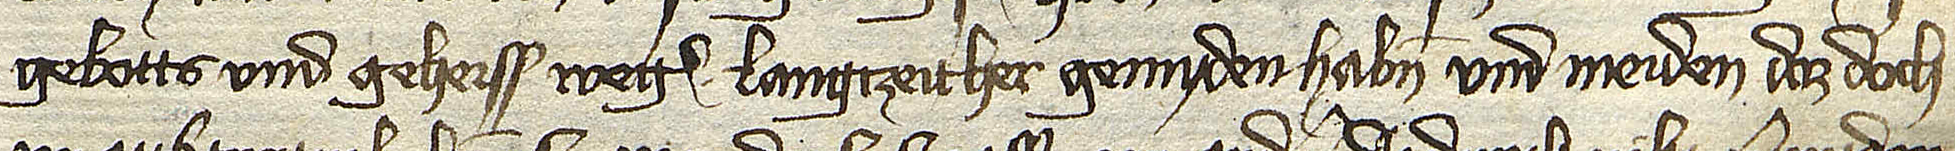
gebotts vnd geheiſſ weg* / langcʒeit her gemyden habn* vnd meiden daʒ doch
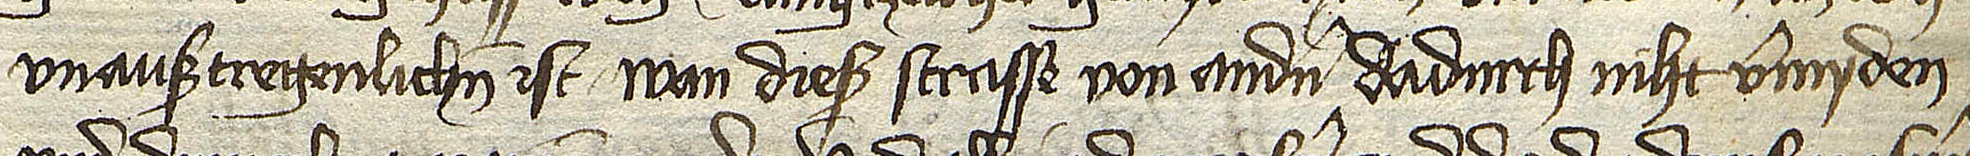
vnauſʒtregenlichn* iſt / wan dieſ* ſtraſſe von andn* dadurch niht v*myden
